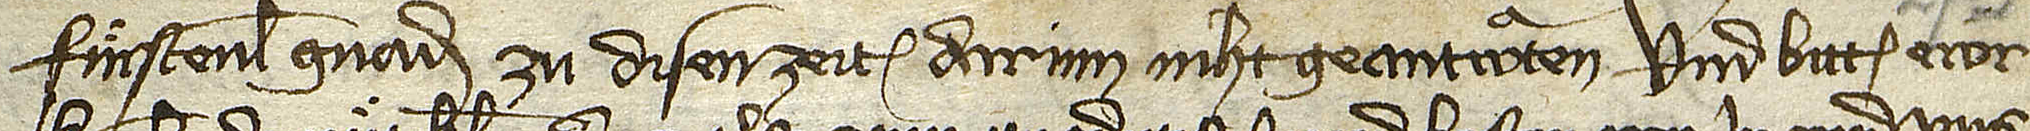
fürſtenl* gnad* ʒu diſen ʒeit* darinn niht geantw*ten Vnd bitt* ewr
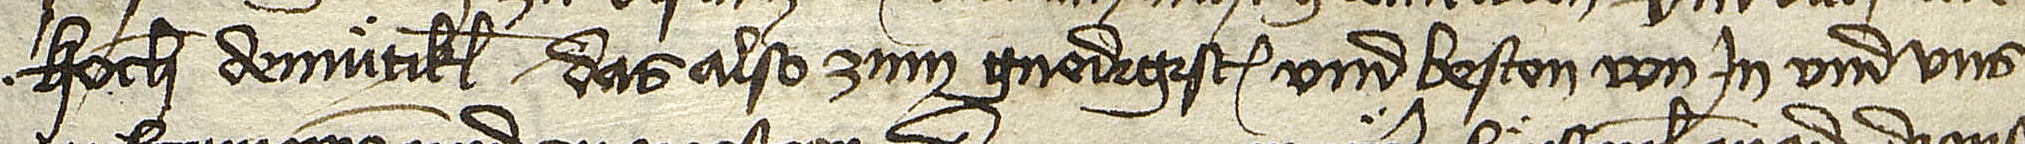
hoch* demütikl* / das alſo ʒum gnedigiſt* vnd beſten von In vnd vns
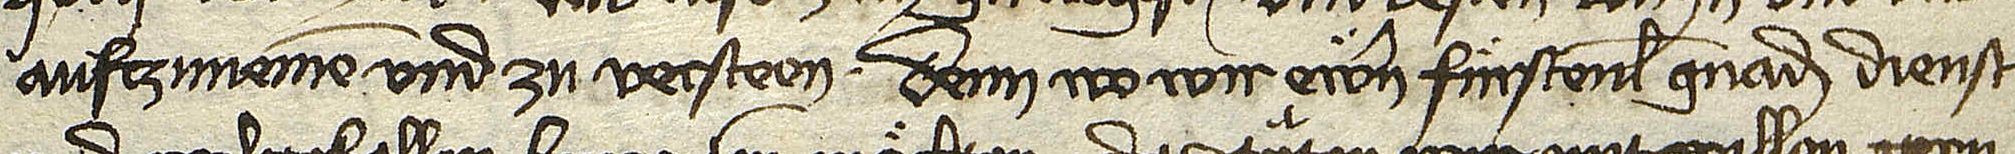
aufcʒuneme* und ʒu verſteen . Denn wo wir ewn* fürſtenl* gnad* dienſt
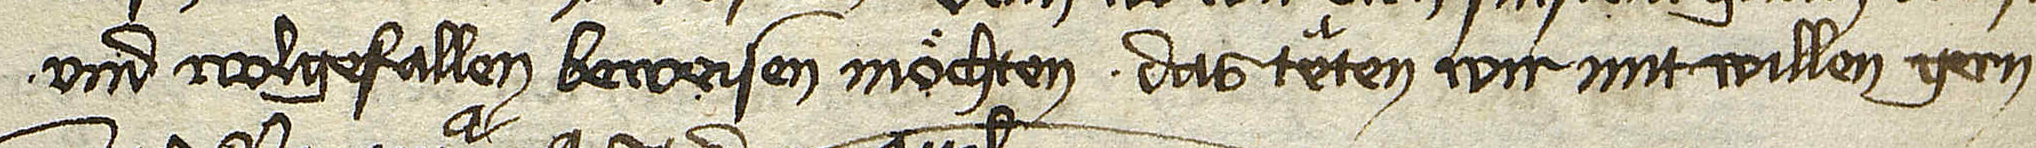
vnd wolgefallen beweiſen möchten . das tëten wir mit willen gern
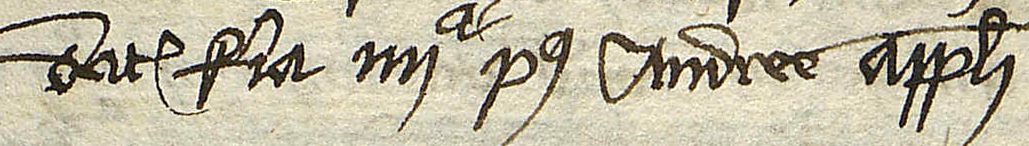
Dat* f*ia iiii* p* Andree appli*
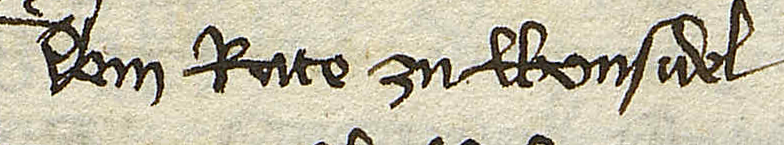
Dem Rate ʒu Wonsidel
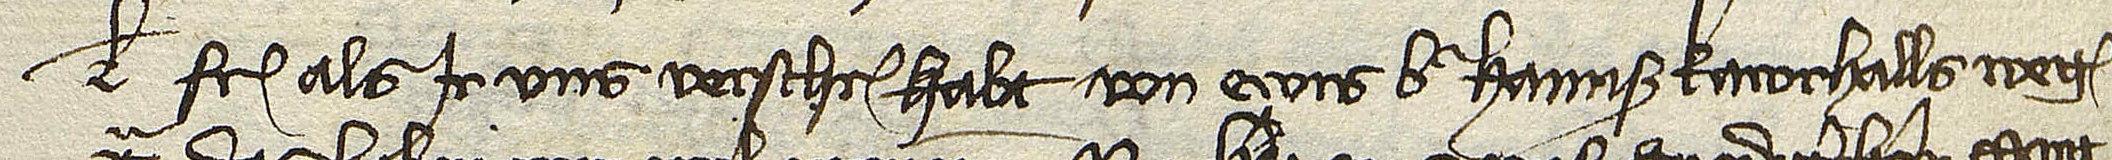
L* fr* als Ir vns verſchr* habt von ewrs b* hannſ* kawrhalls weg*
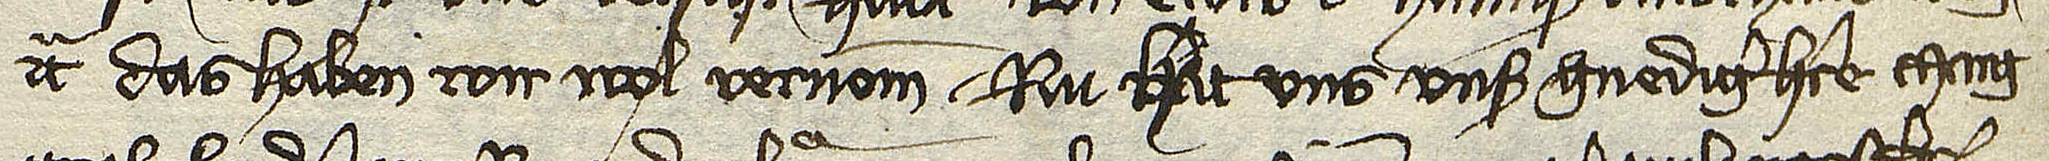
ec* das haben wir wol vernom* / Nu hat vns vnſ* gnedig* hre* Marg =
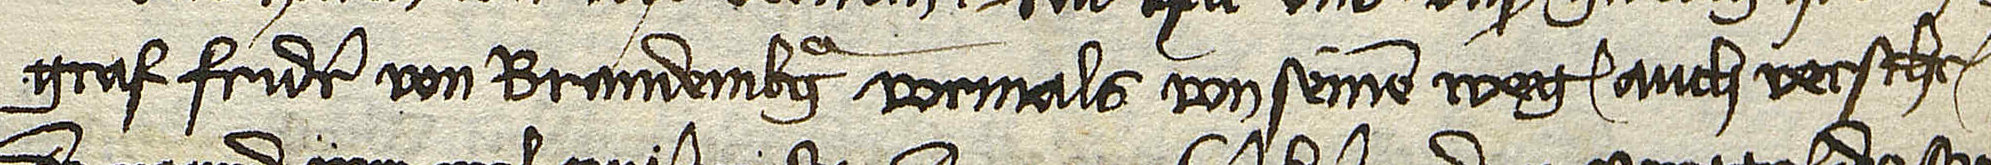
graf fridr* von Brandemb*g vormals von ſeine* weg* auch verſchr*
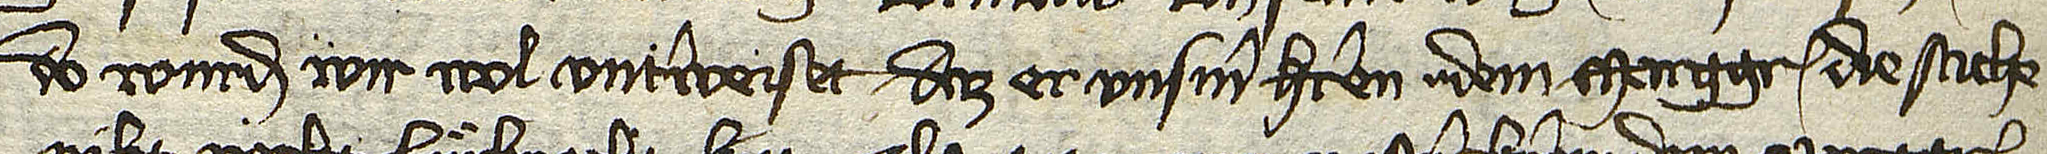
do wurd* wir wol vnt*weiſet / daʒ er vnſ*m h*ren ~ dem Marggr* die ſache
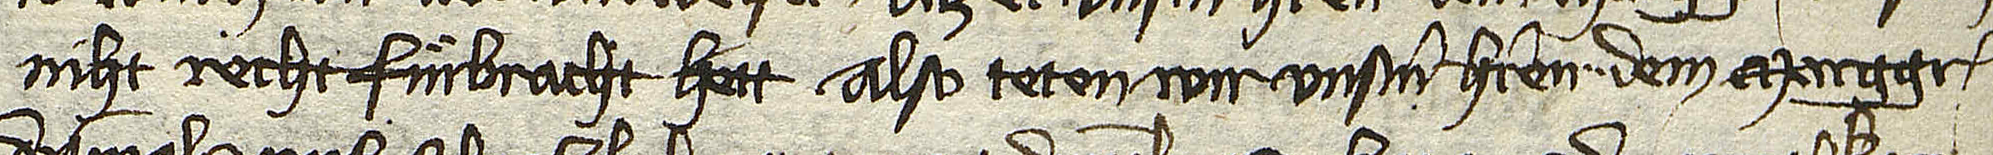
niht recht fürbracht hett / alſo teten wir vnſ*n h*ren ~ dem Marggr*
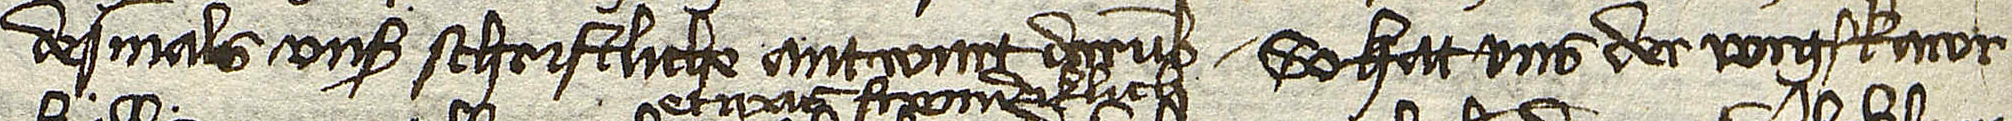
deſmals vnſ* ſchriftliche antwurt darub* / So hat vns der vorg* kawr
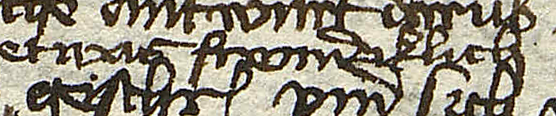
etwas fremdiklich
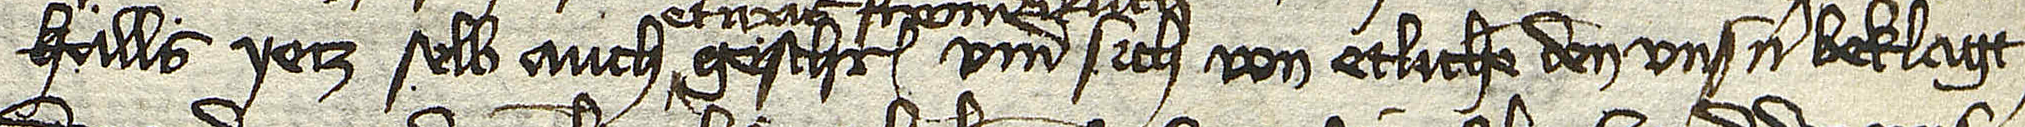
halls yecʒ ſelb auch geſchr* vnd ſich von etliche* den vnſ*n beklagt
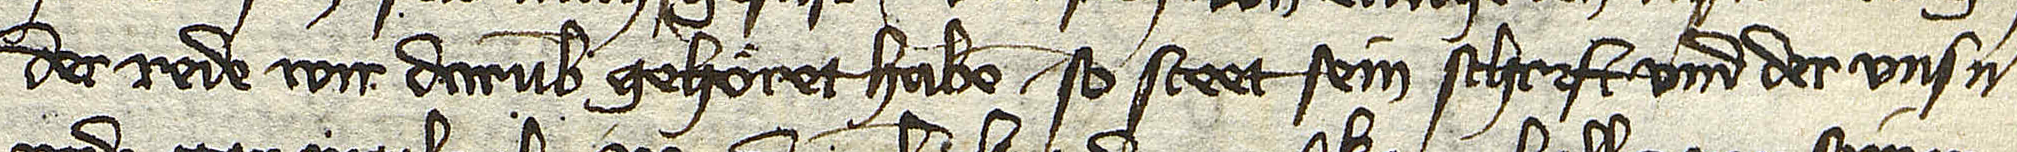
der rede wir daru*b gehöret habe* / ſo ſteet ſein ſchrift vnd der vnſ*n
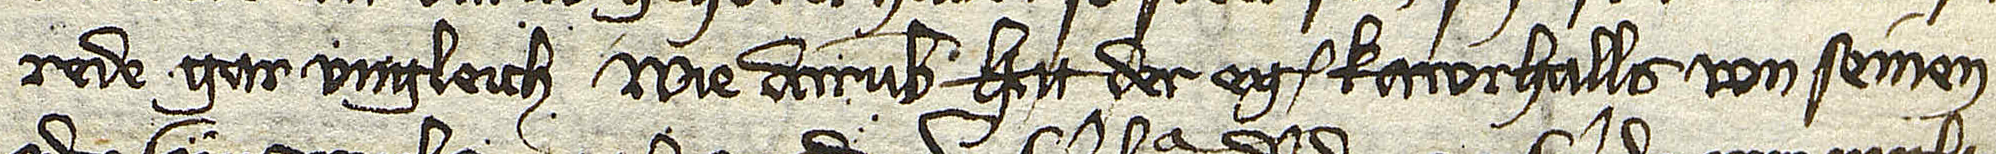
rede gar vngleich wie daru*b hat der eg* kawrhalls von ſeinen
